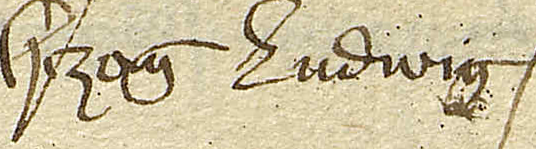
h*cʒog Ludwig*
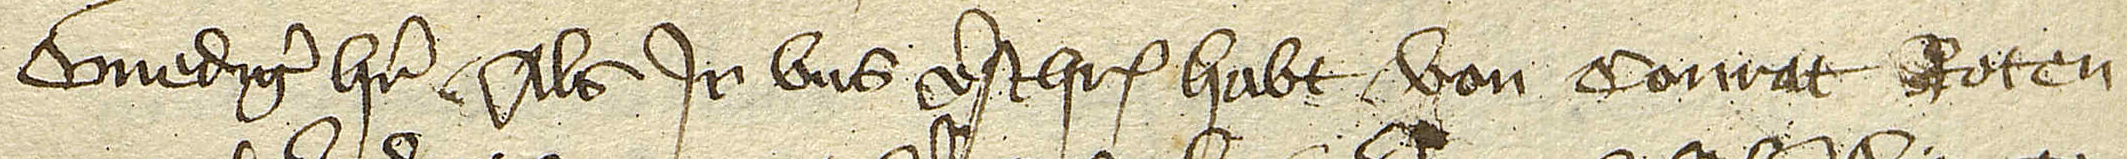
Gnedig* hr* / Als Ir vns v*ſchr* habt / von Conrat Roten
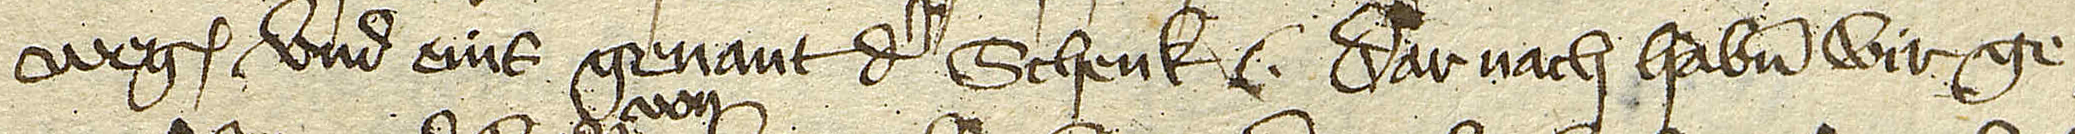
weg* / vnd eins genant d* Schenk / . Darnach habn* wir ge
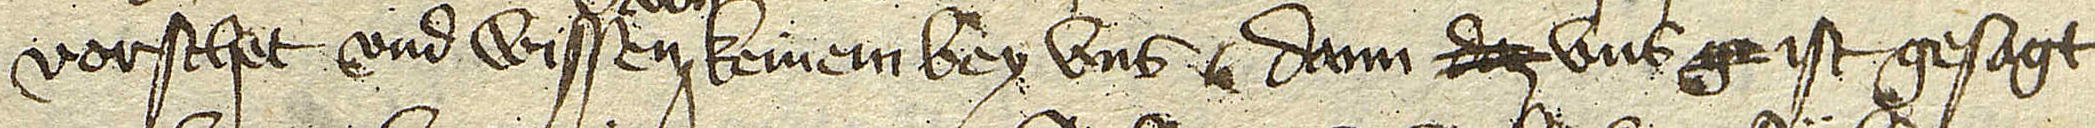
vorſchet vnd wiſſen keinen bey vns / dann daʒ vns ge iſt geſagt
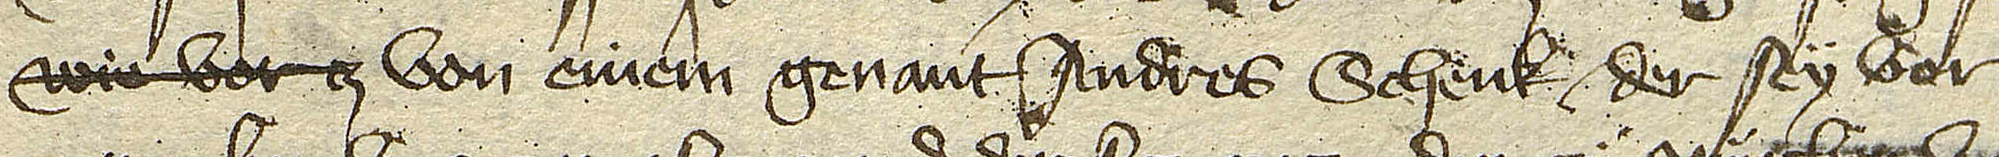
wie vor cʒ von einem genant Andres Schenk / der ſey vor
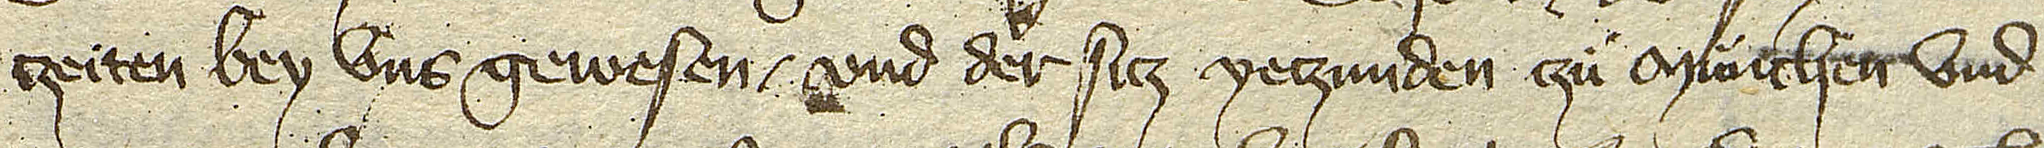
cʒeiten bey vns geweſen / vnd der ſicʒ yecʒunden cʒü München vnd
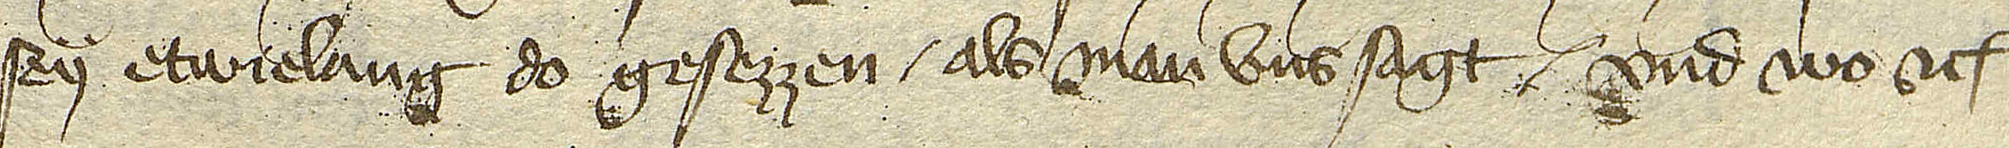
ſey etwielang do geſeʒʒen / als man vns ſagt / vnd wo ec*
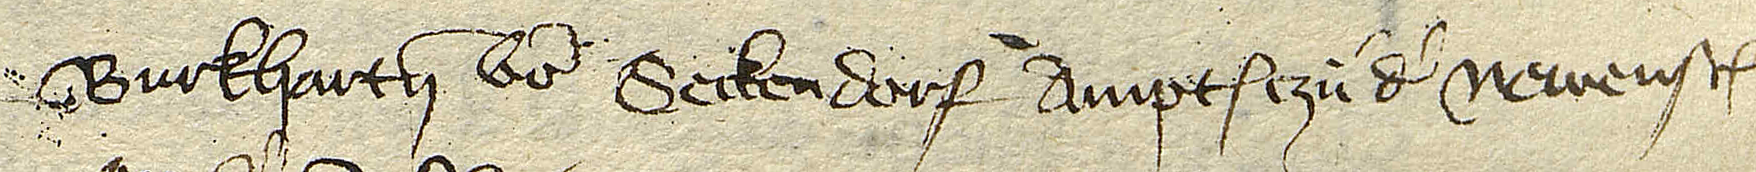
Burkhartn* vo* Seckendorf Ampt* cʒü Newenſt*
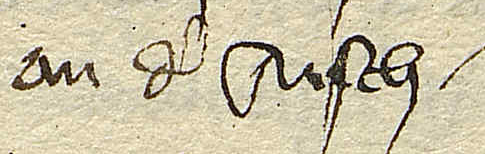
an d* Aiſch /
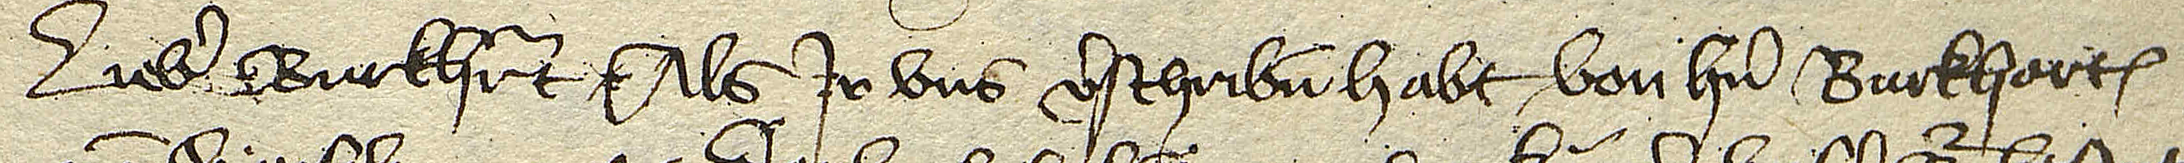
Lieb* Burkh*rt / Als Ir vns v*ſchribn* habt von hn* Burkhart*
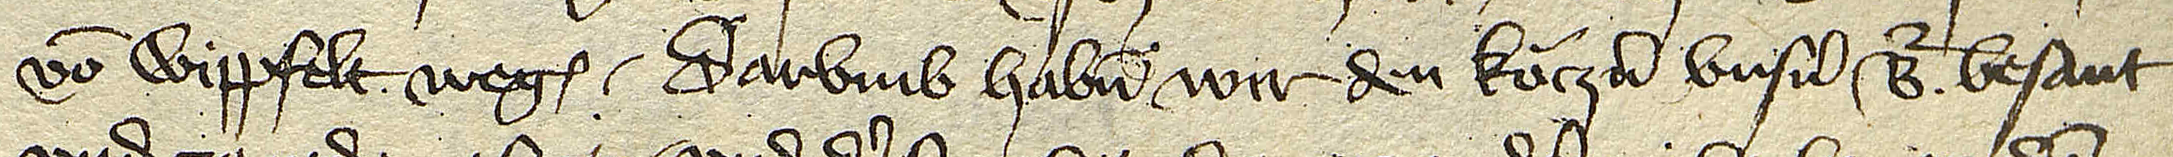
vo* wippfelt / Darvmb habn* wir den köcʒn* vnſn* B* beſant
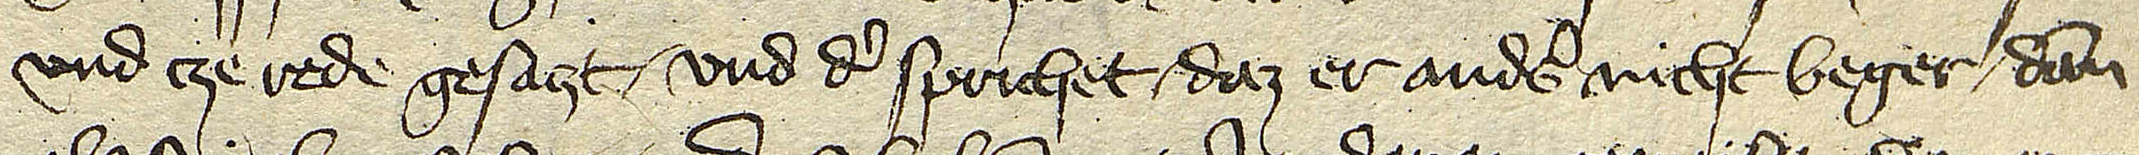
vnd cʒe rede geſacʒt / vnd d* ſprichet / daʒ er ands* nicht beger / dan*
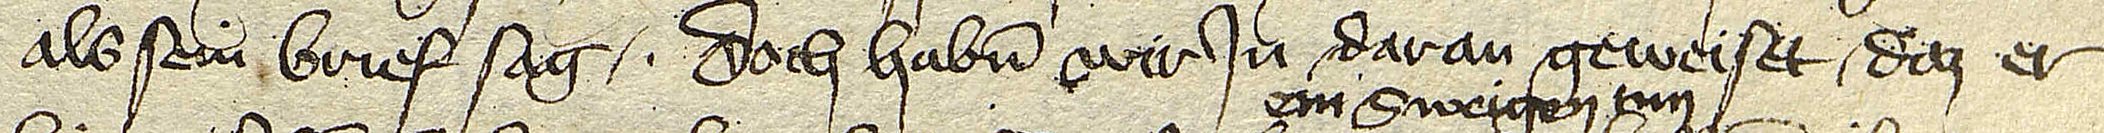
als ſein brief ſag / . Doch habn* wir In daran geweiſet / daʒ er
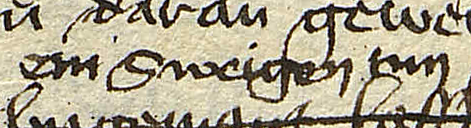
ein Sweigen tun
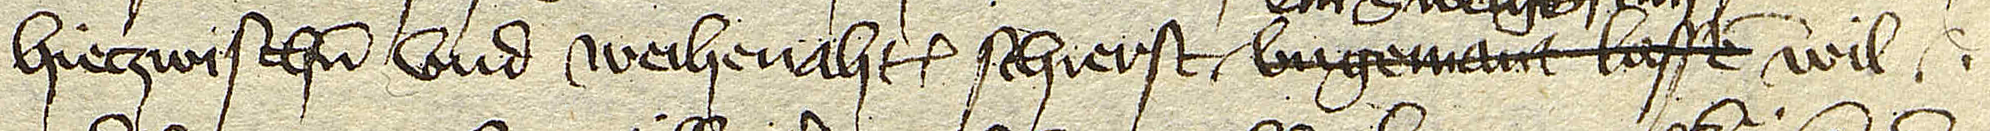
hiecʒwiſchn* vnd weihnaht* ſchierſt / vngemant laſſe* wil / .
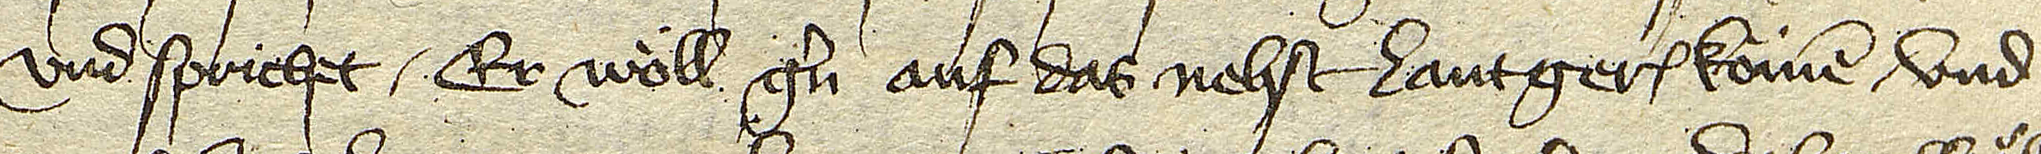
vnd ſprichet / Er wöll g*n auf das nehſt Lantger* köme* / vnd
